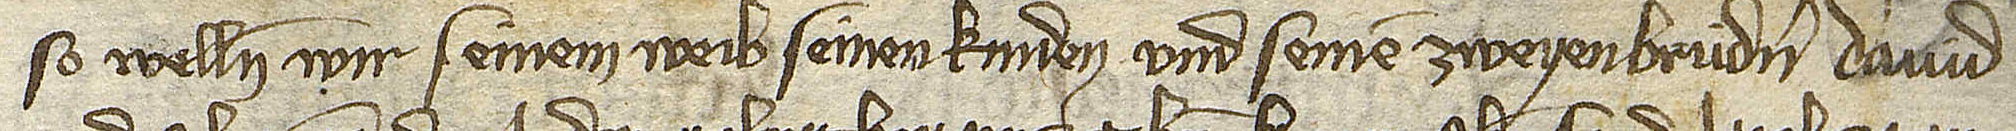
ſo welln* wir ſeinem weib ſeinen kinden vnd ſeine* ʒweyen brüdn* David
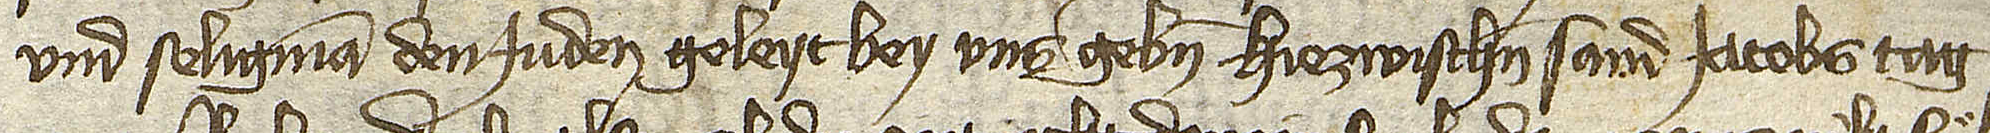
vnd ſeligma* den Iuden geleyt bey vns gebn* hieʒwiſchn* ſand Iacobs tag
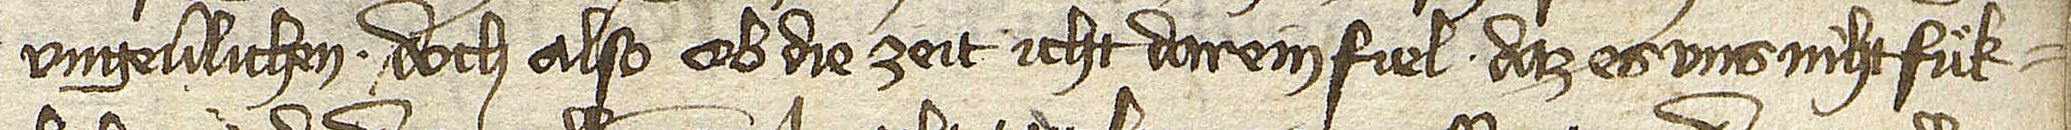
vngeu*lichen . Doch alſo Ob die ʒeit icht darein fiel . daʒ es vns niht fük =
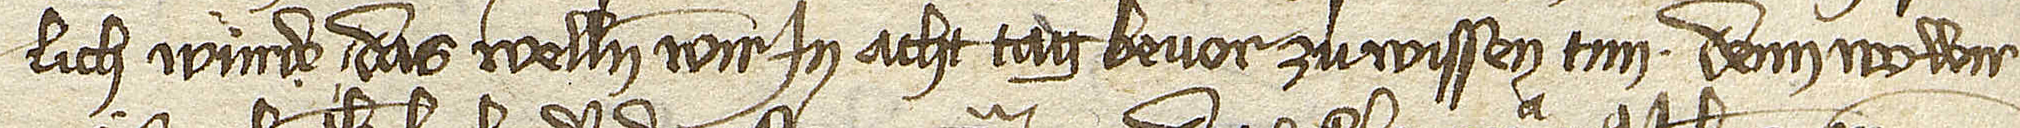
lich würde / Das welln* wir In acht tag beuor ʒu wiſſen tun . Denn wo wir
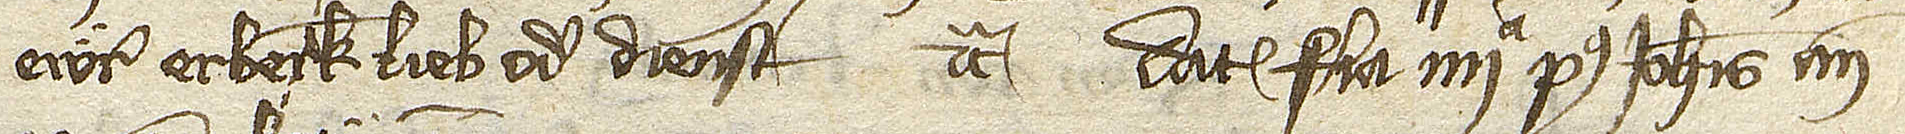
eẅr* erberk* lieb od* dienſt ec* Dat* fi*a iiii* p* Ioh*is an*
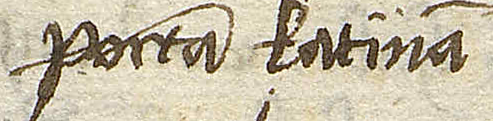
Porta* Latina*
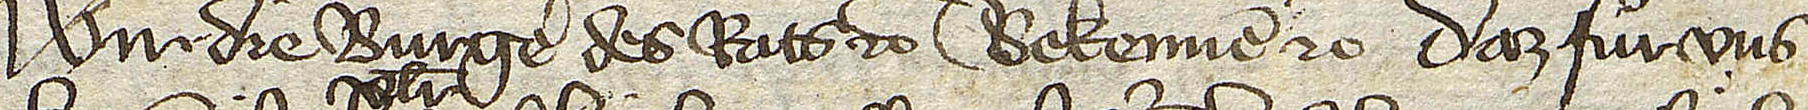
Wir die Burge* des Rats ec* Bekenne* ec* Daʒ für vns
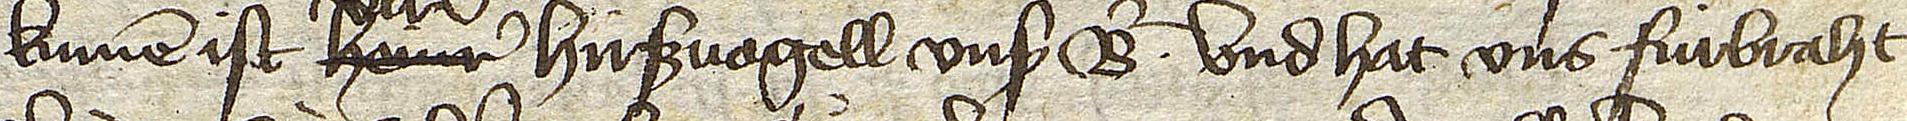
kume* iſt heinr* hirſʒuogell vnſ* B* . Vnd hat vns fürbraht
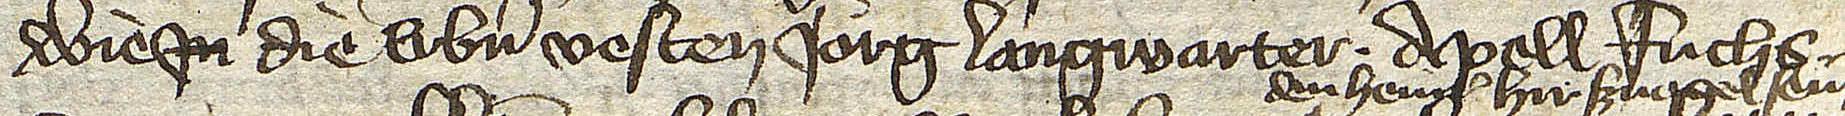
wie In die Erbn* veſten Iörg langwarter . Apell Fuchs
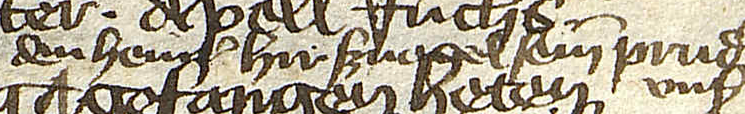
den heinr* hirſʒuogel ſein* prud*
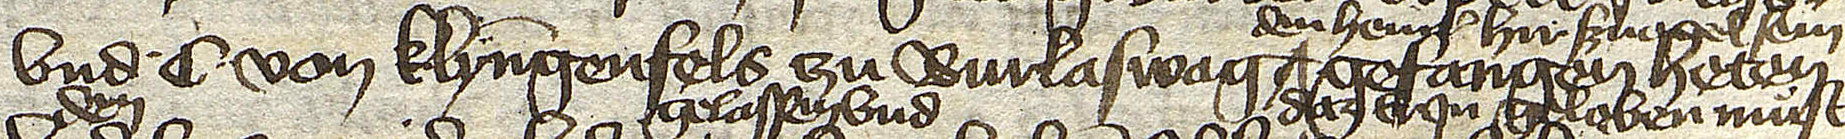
vnd . C . von klyn*genfels cʒu Burlaſwag / gefangen heten
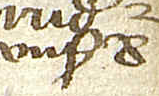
vnſ* B*
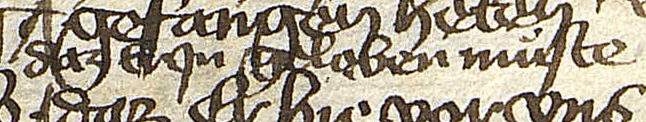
daʒ Er In geloben müſte
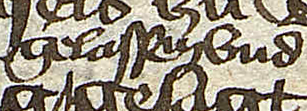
gelaſſen vnd
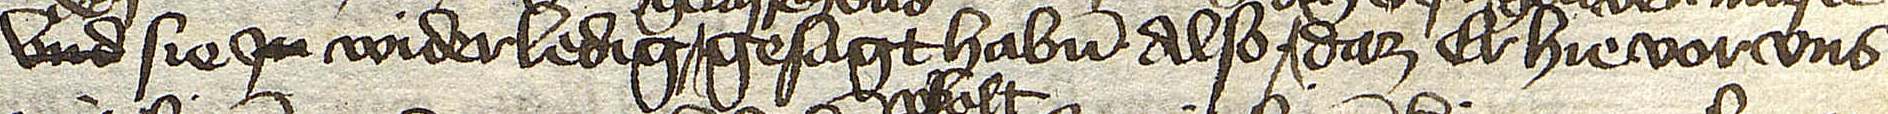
vnd ſie In widerledig geſagt habn* Alſo daʒ Er hie vor vns
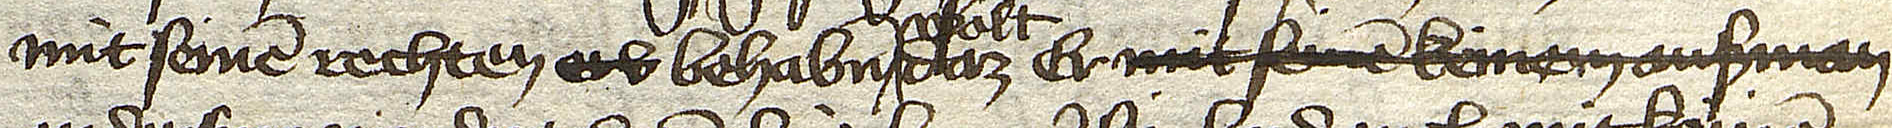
mit ſeine* rechten erb behabn* daʒ Er mit ſeine* keinem auſʒman
